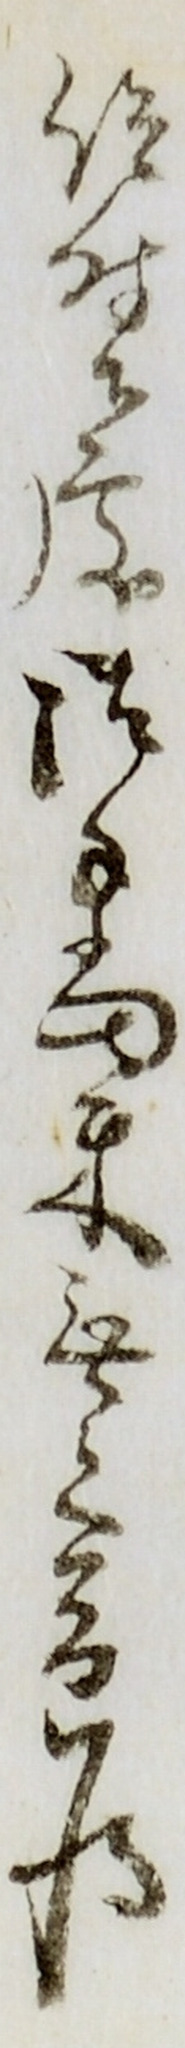仰付候処御手当米無之候間為
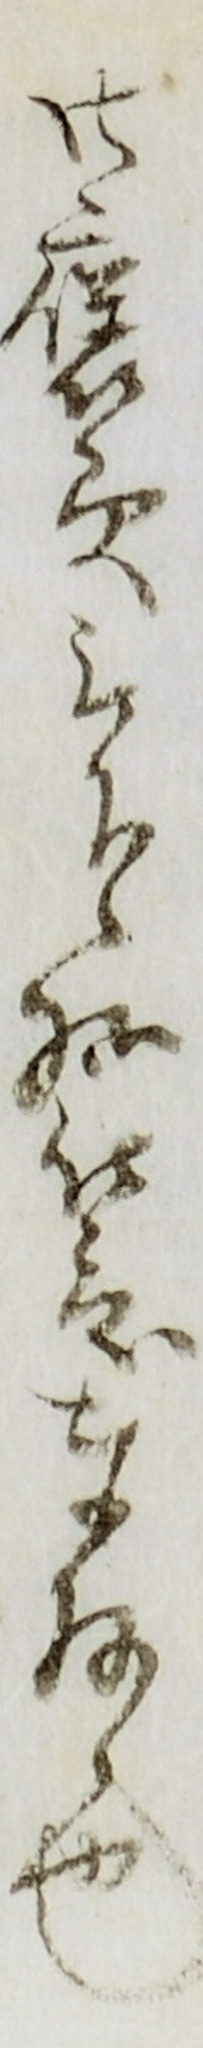御褒美被下候様仕度奉存候也
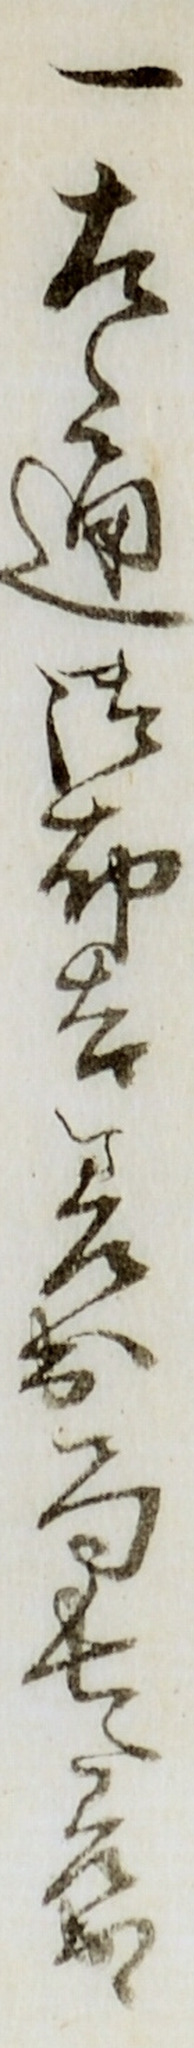一左之通御布告差出局長へ差出候
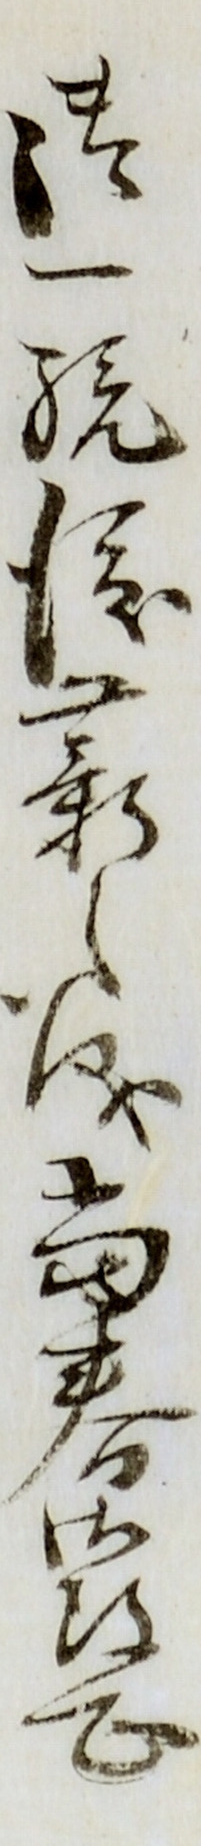御一統渡薪之儀当春御改正
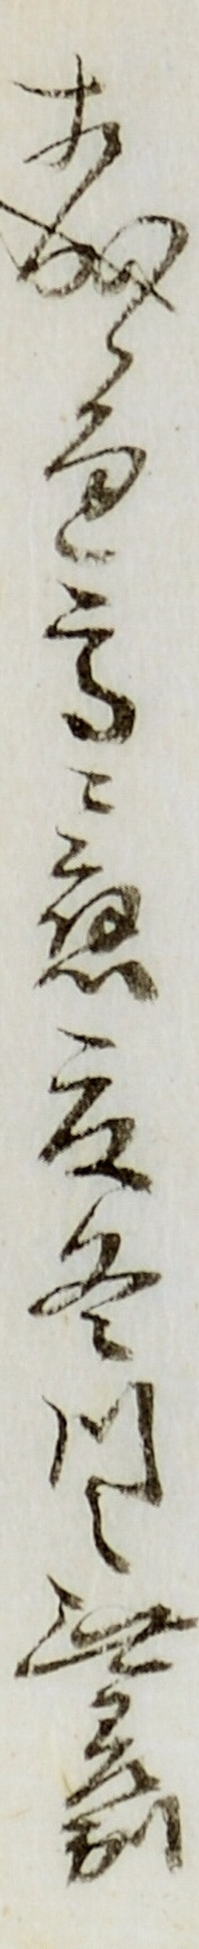相成候通高に応夏冬川之無差別
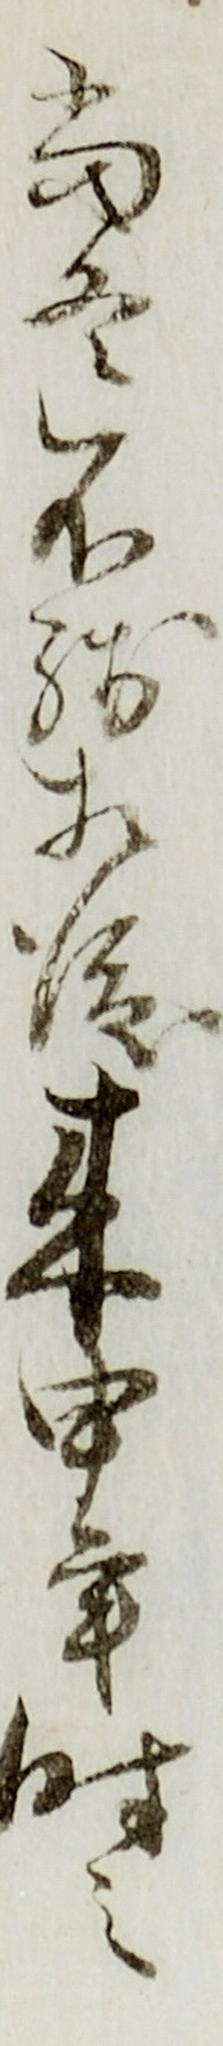当冬不残相渡来申年時之
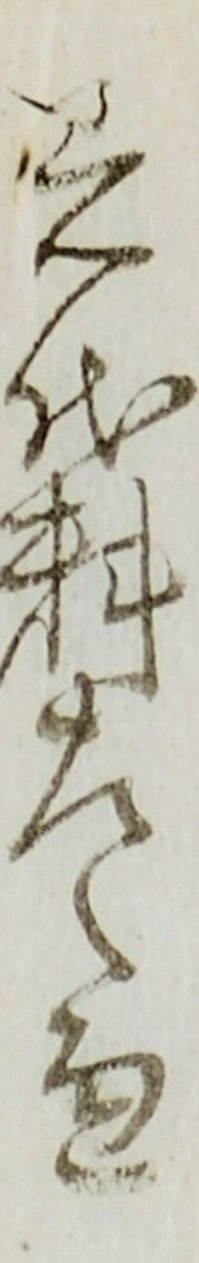着代料左之通
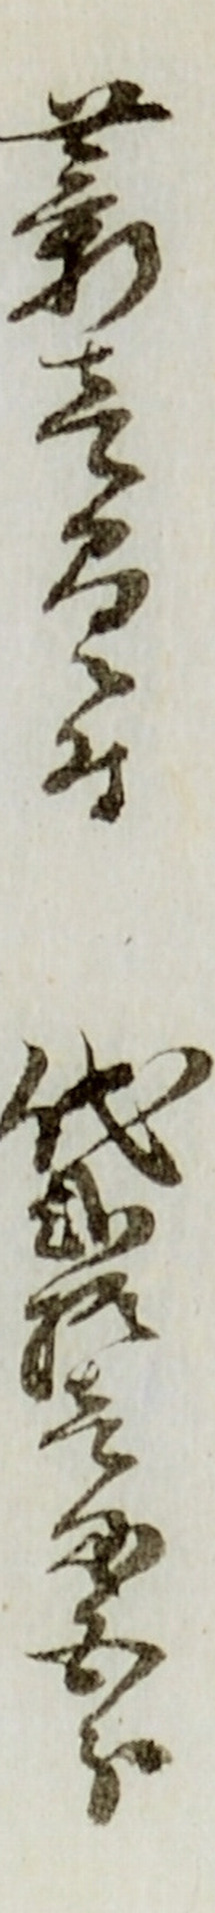薪壱間に付代弐拾壱匁五分
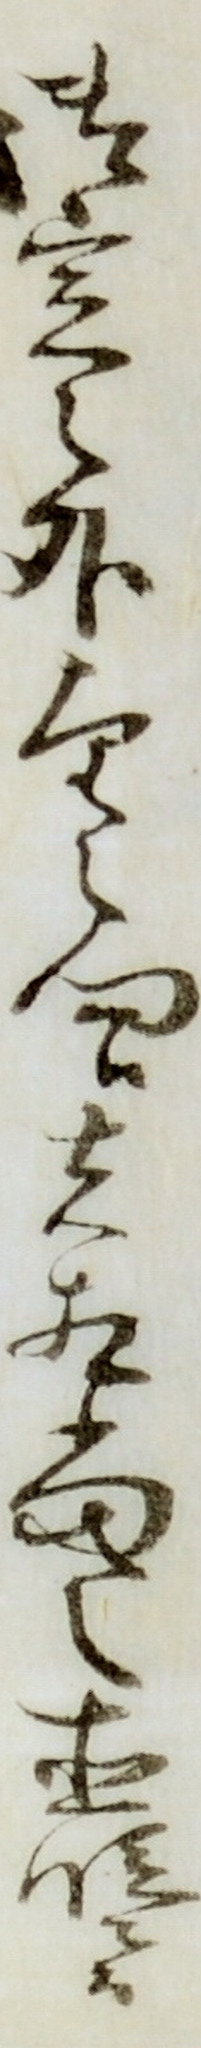御定之外望之向えは相当之直段にて
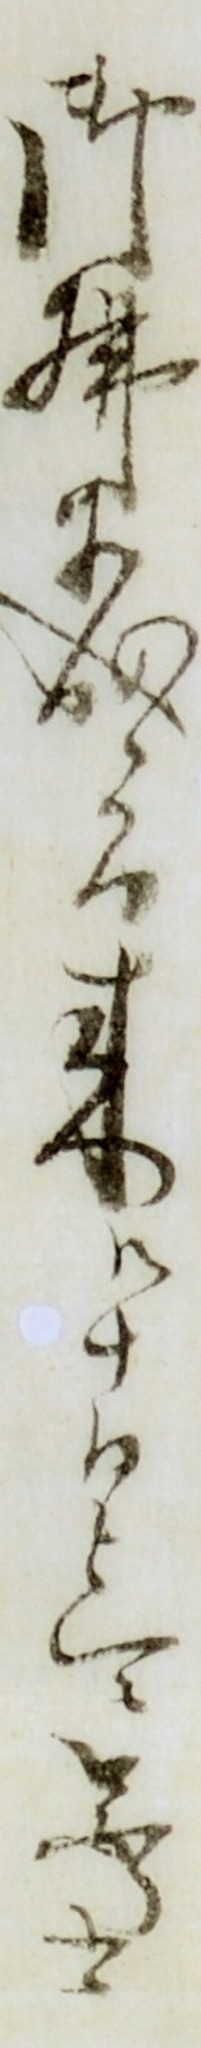御払相成候間来ル十日迄に図り書

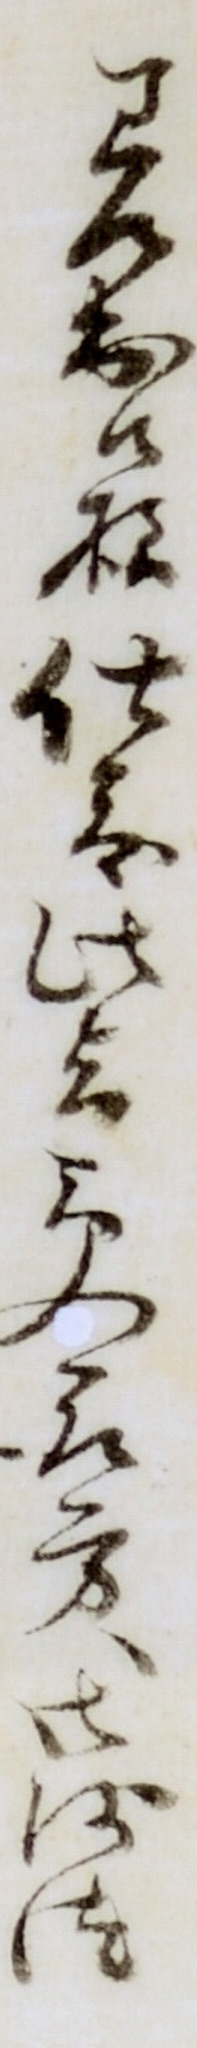差出候様仕度此旨受取方へ御沙汰
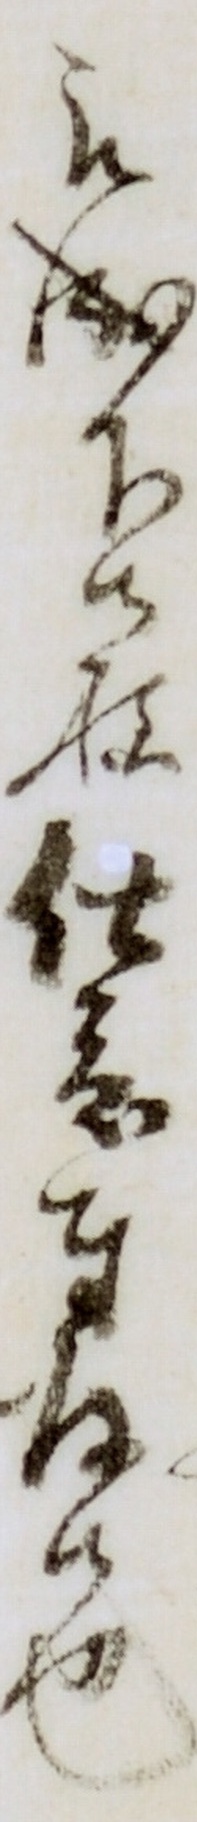被成下候様仕度奉存候也
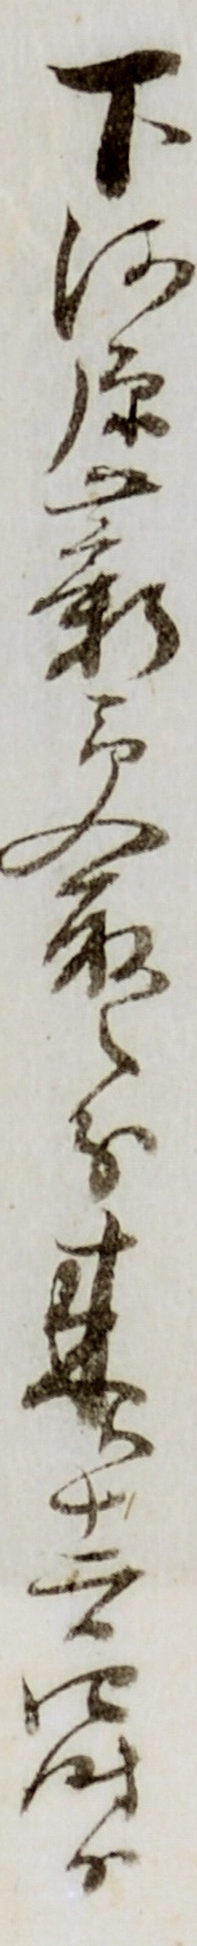下河原薪受取之分来ル十二日四時ゟ
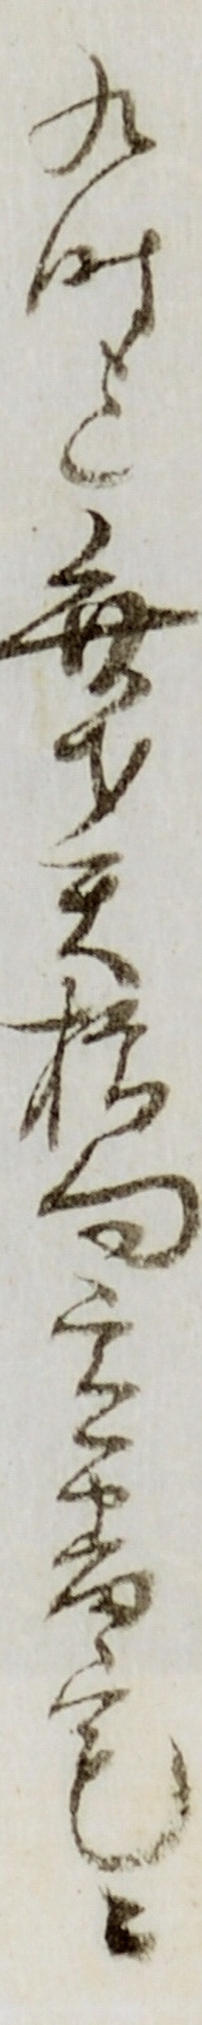九時迄弁財天橋向定番宅に
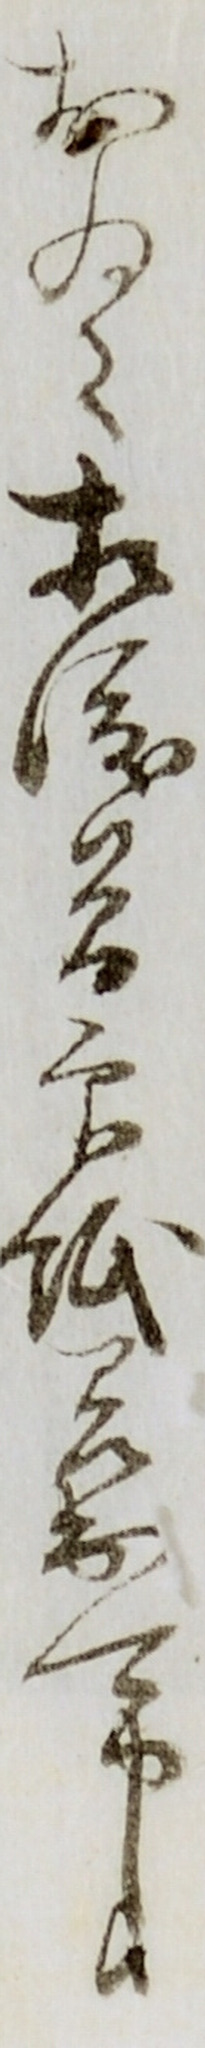おゐて相渡候間印紙差出可申候
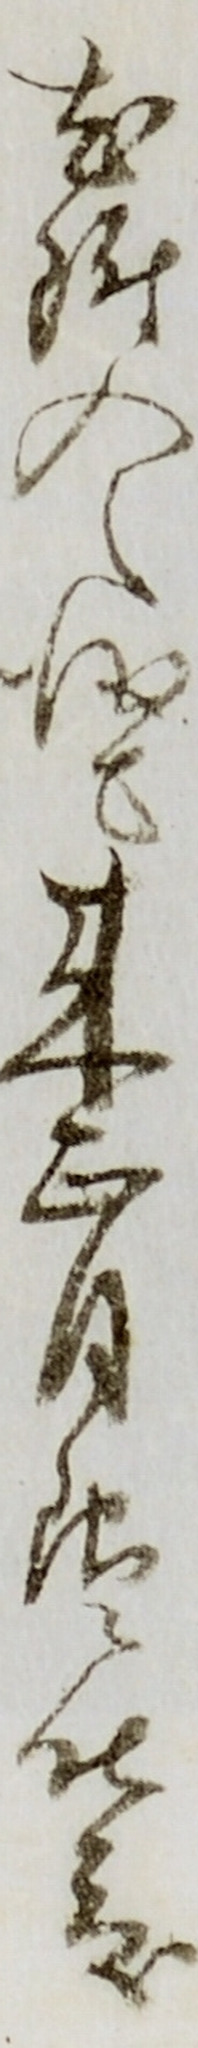尤附入之儀は来正月銀に仕度
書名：山林方諸事御用留
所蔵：伊那市立高遠町図書館・合同会社AMANE
